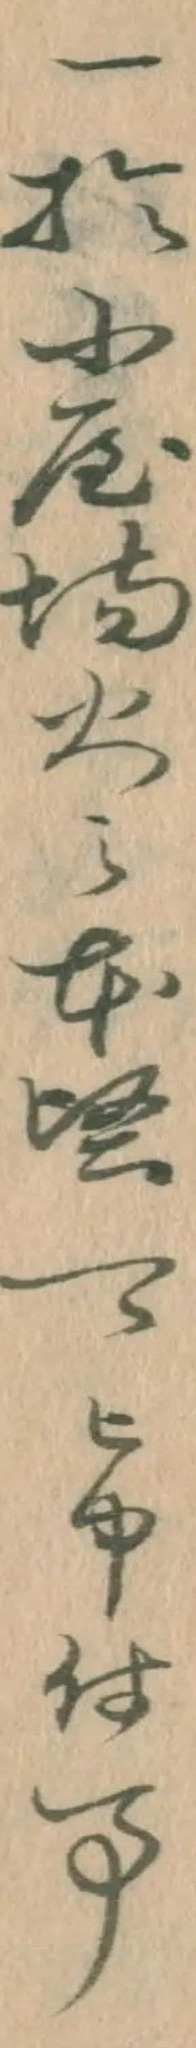一於小屋場火之本堅可被申付事
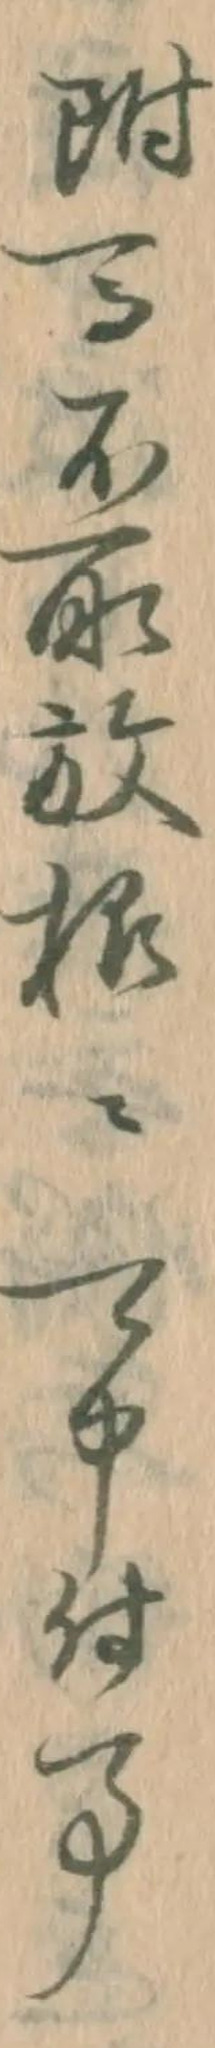附馬不取放様に可申付事
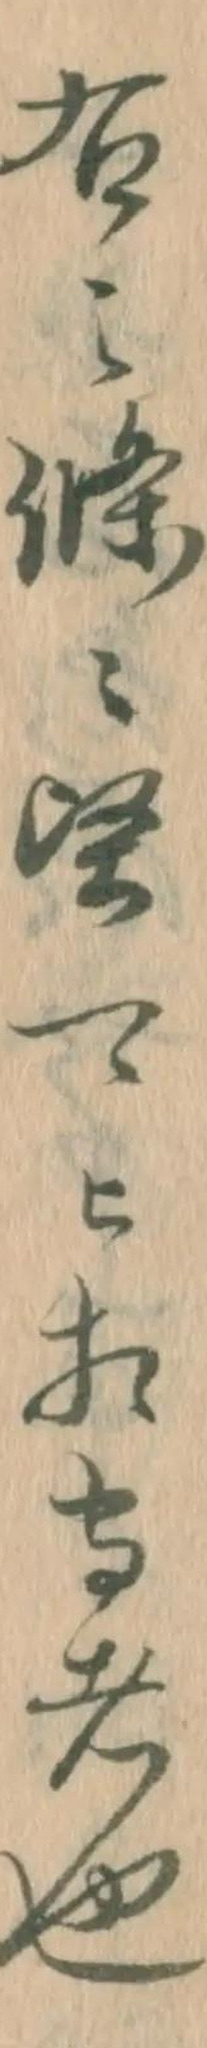右之條々堅可被相守者也
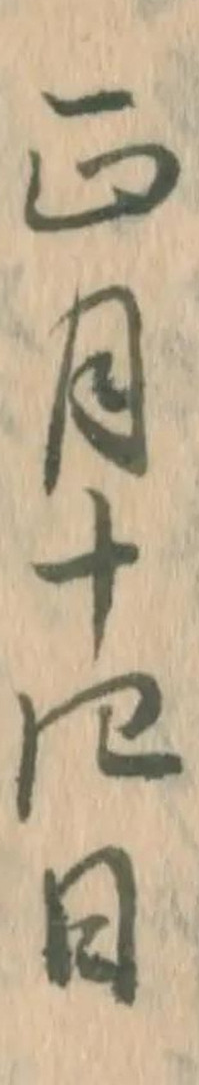正月十三日
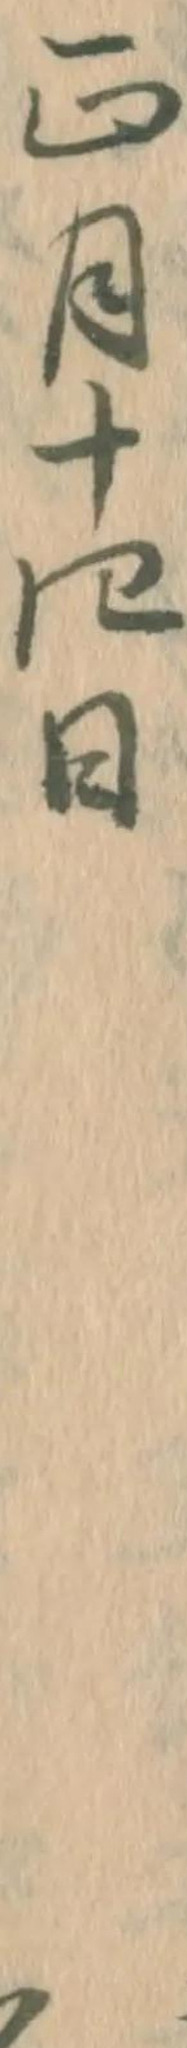正月十三日
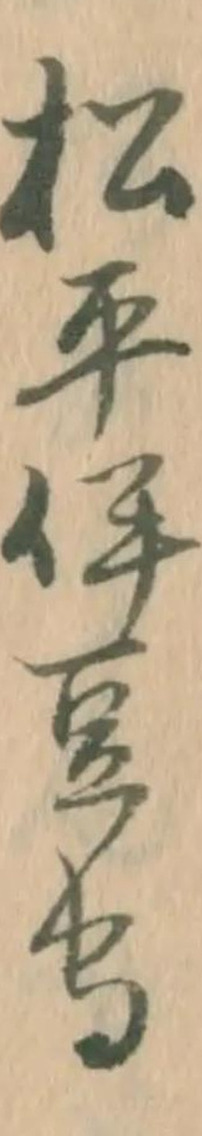松平伊豆守

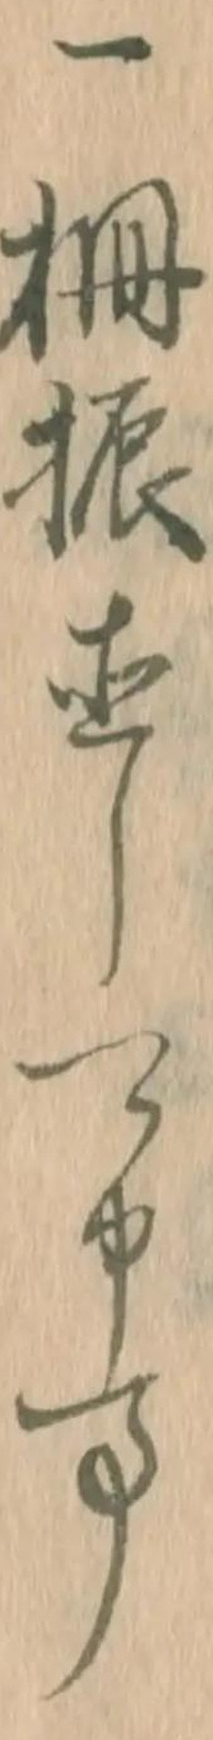一柵振直し可申事
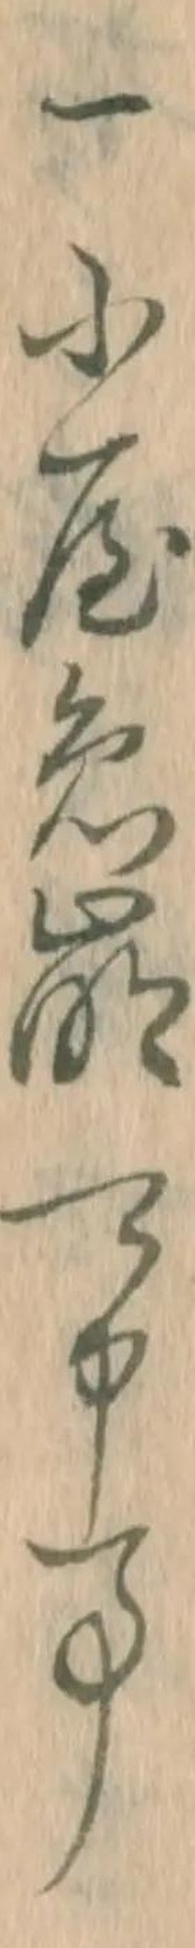一小屋急崩可申事
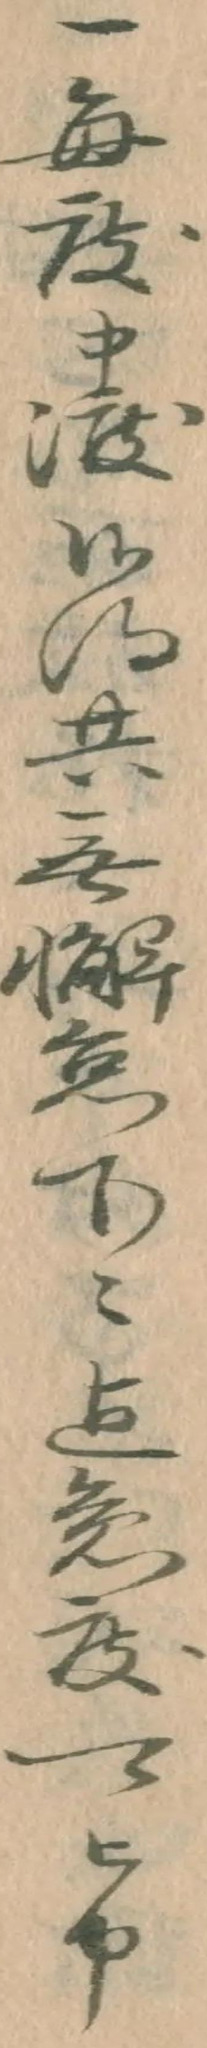一毎度申渡候得共無懈怠下々迄急度可被申
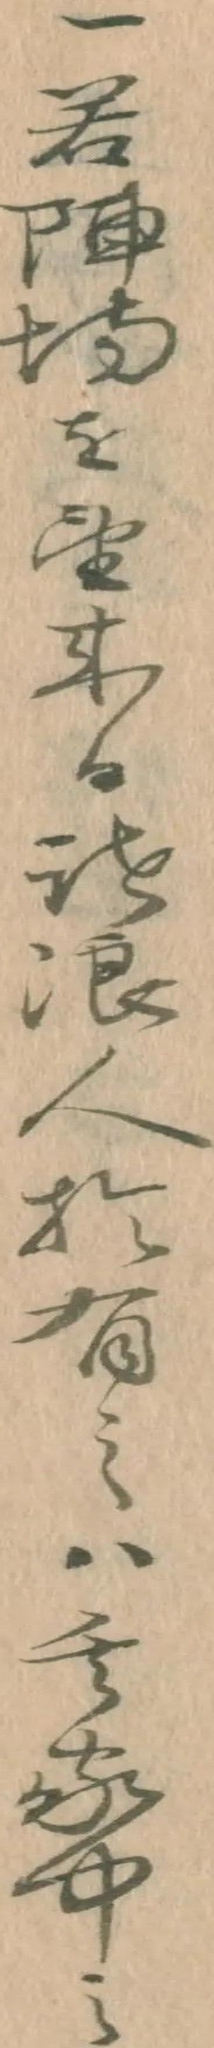一若陣場を望来る諸浪人於有之は其家中之
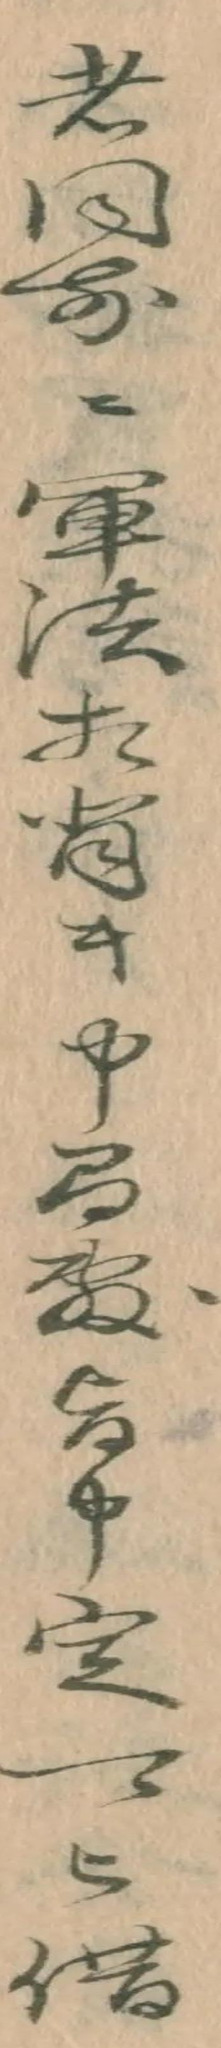者同前に軍法相背き申間敷旨申定可被借
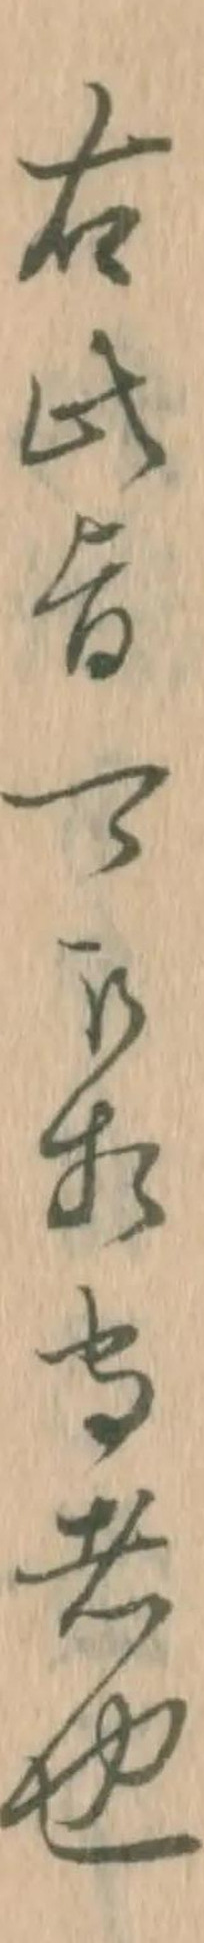右此旨可被相守者也
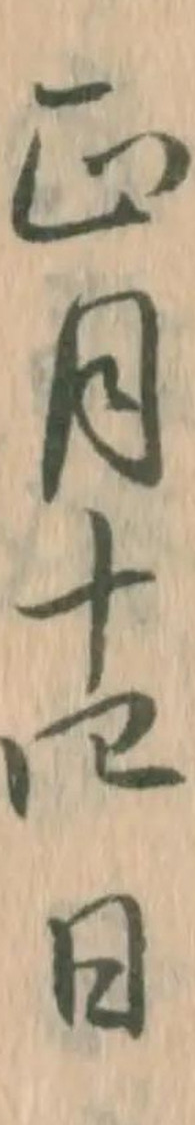正月十四日
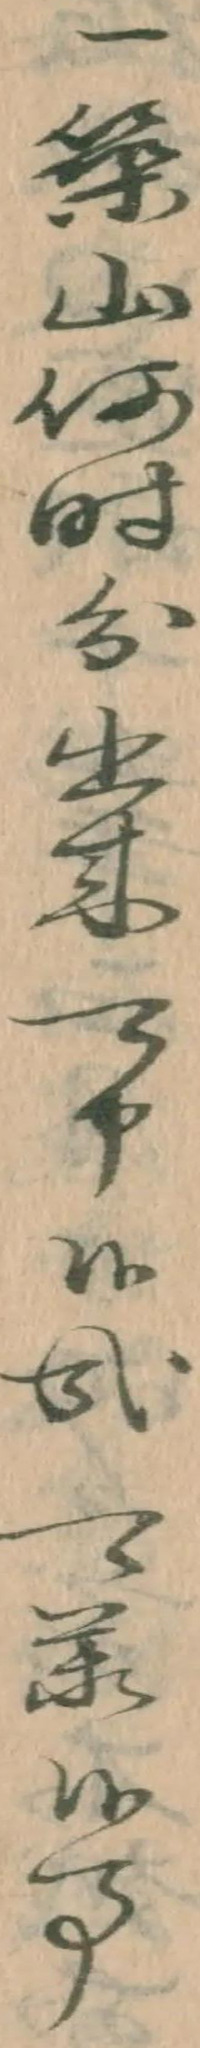一築山何時分出来可申候哉可承候事
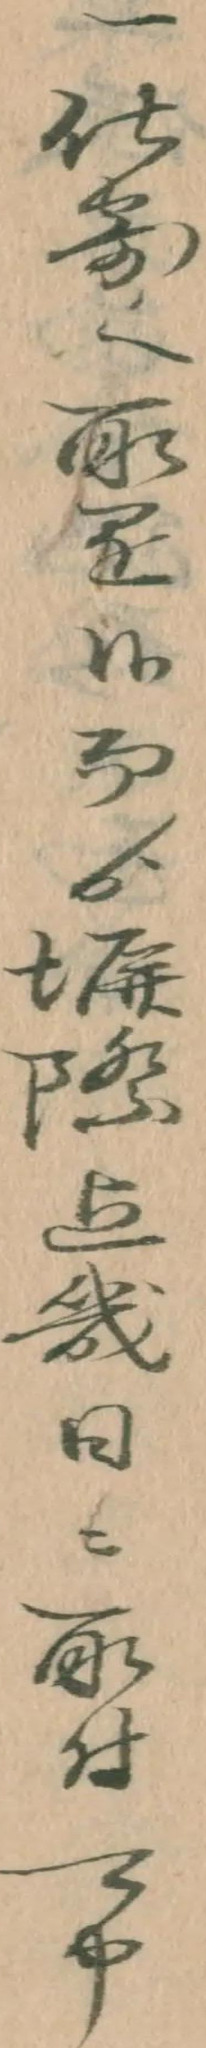一仕寄へ取懸候而ゟ塀際迄幾日に取付可申
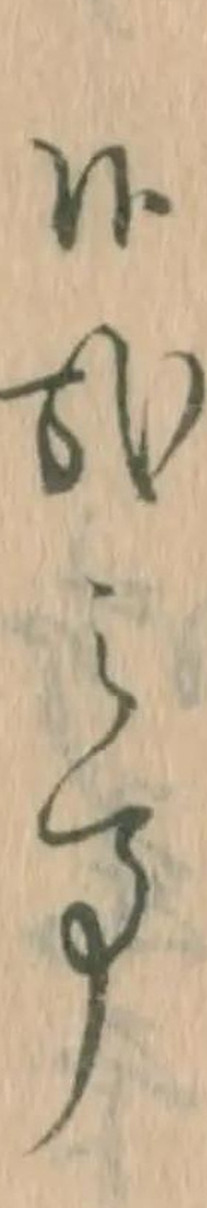候哉之事
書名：切支丹御退治記 49巻. [6]
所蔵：国立国会図書館 National Diet Library, JAPAN
